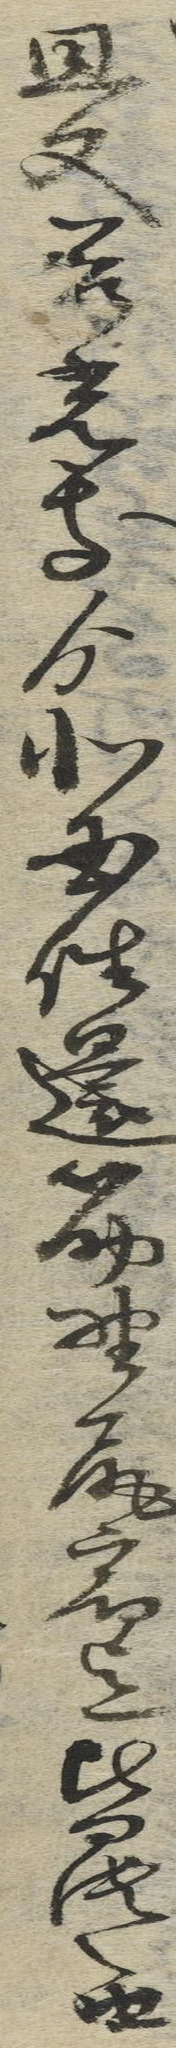且又善光寺ゟ北国往還筋野尻宿迄皆潰之由
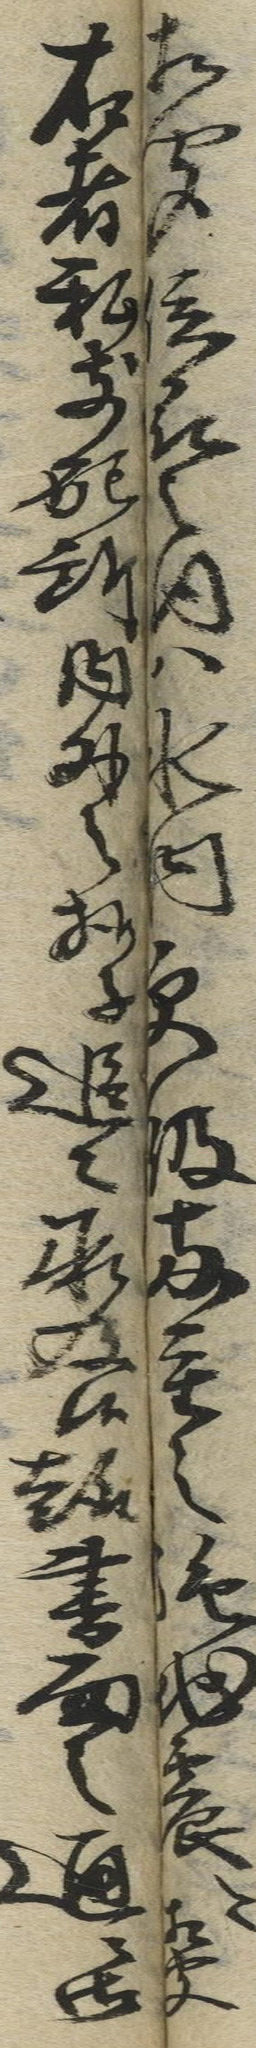右は私支配所内之様子追々承及候趣書面之通二御
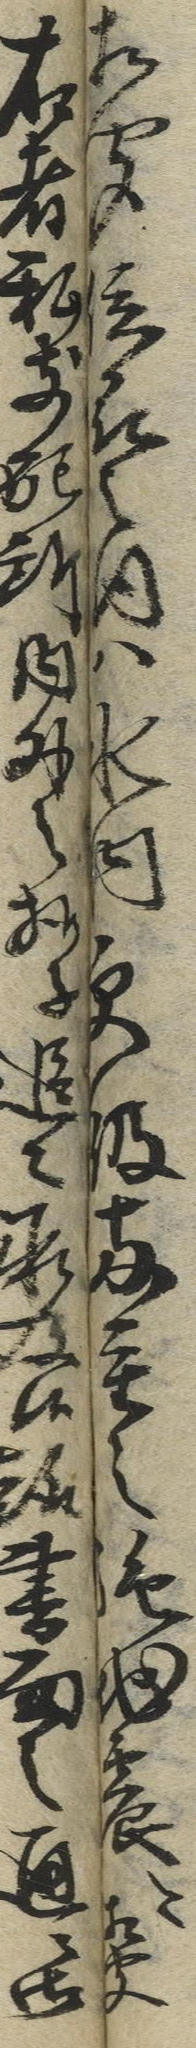右は私支配所内之様子追々承及候趣書面之通二御
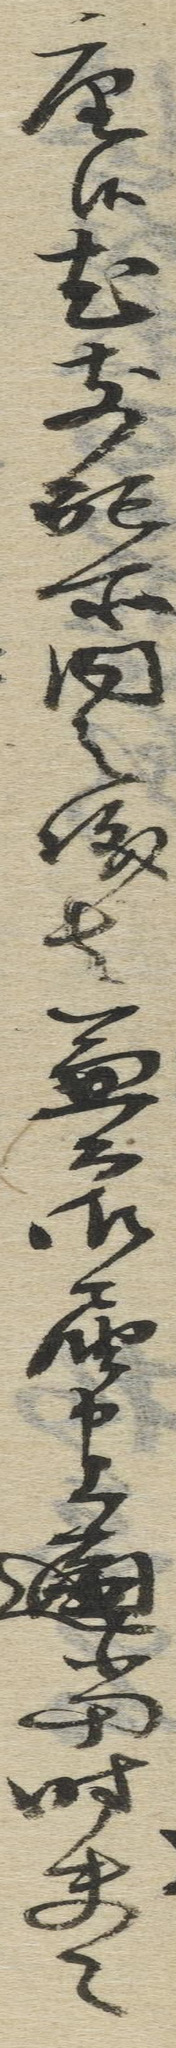座候尤支配所内之儀は兼而御届申上通当時夫々
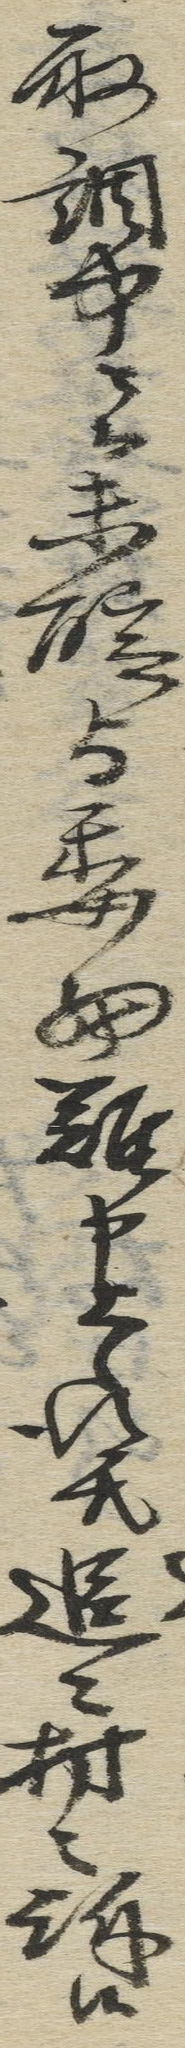取調中二而未聢と委細難申上候得共追々村々訴候
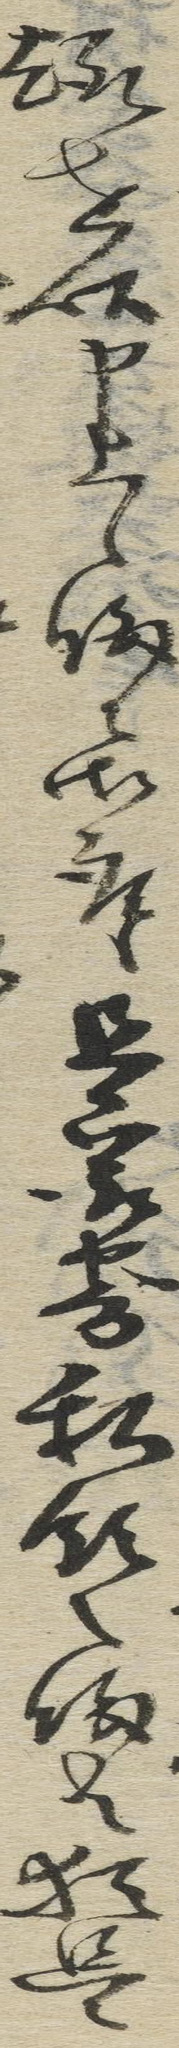趣を以申上候儀二御座候且最寄私領之儀は猶追々
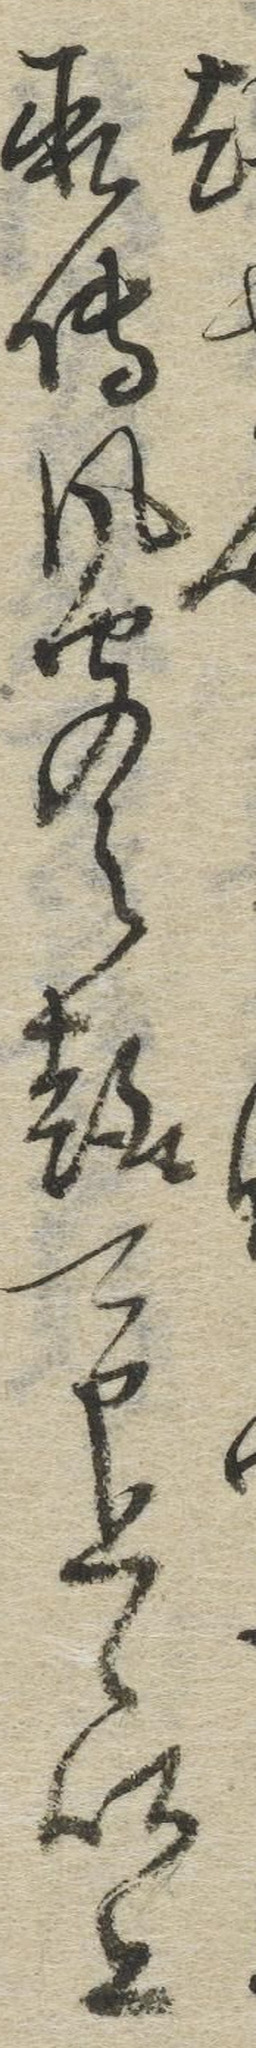承伝風聞之趣可申上候以上
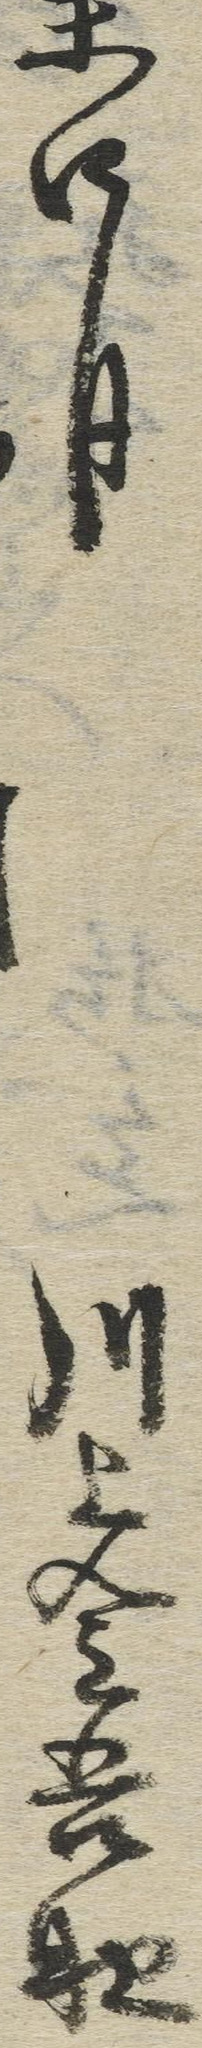未四月川上金吾助
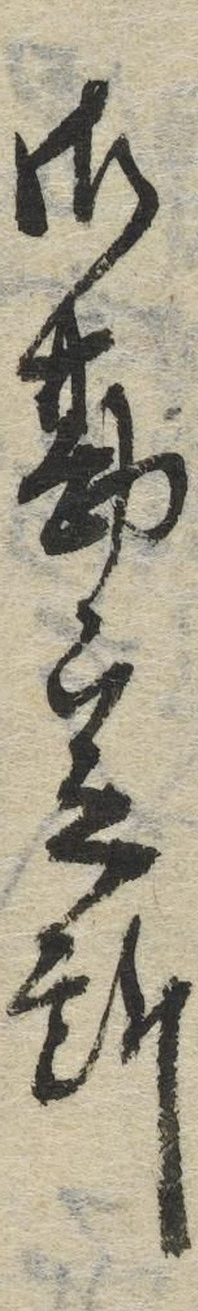御勘定所
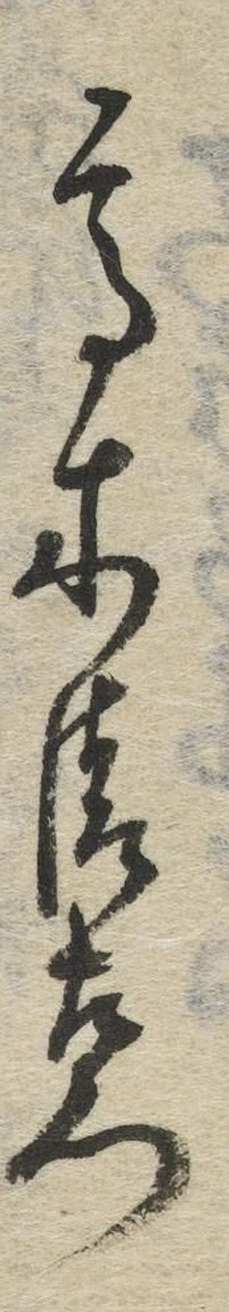高木清左衛門
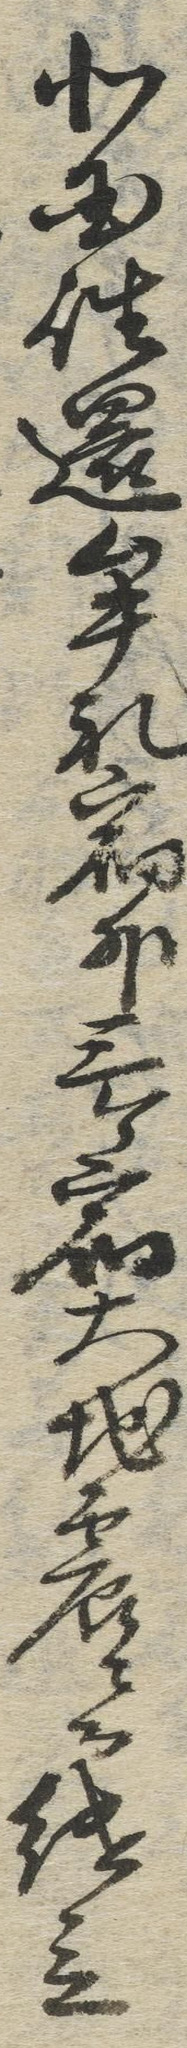北国往還牟礼宿外三ヶ宿大地震二而継立
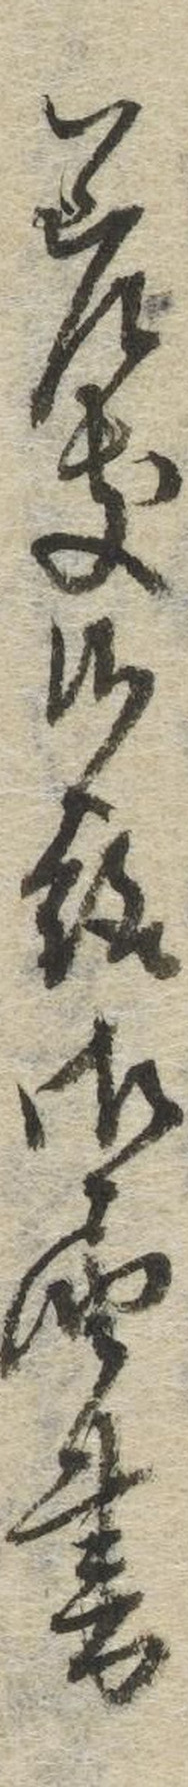差支候趣御届書
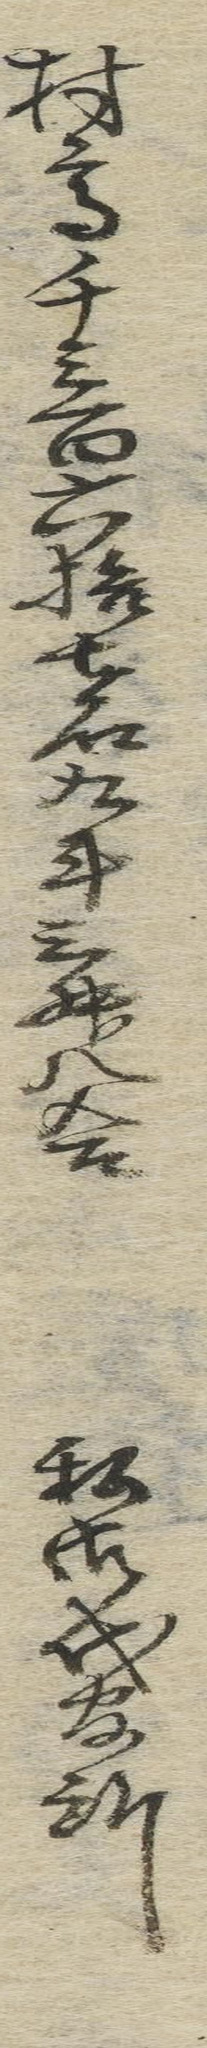村高千三百六拾七石九斗三升八合私御代官所

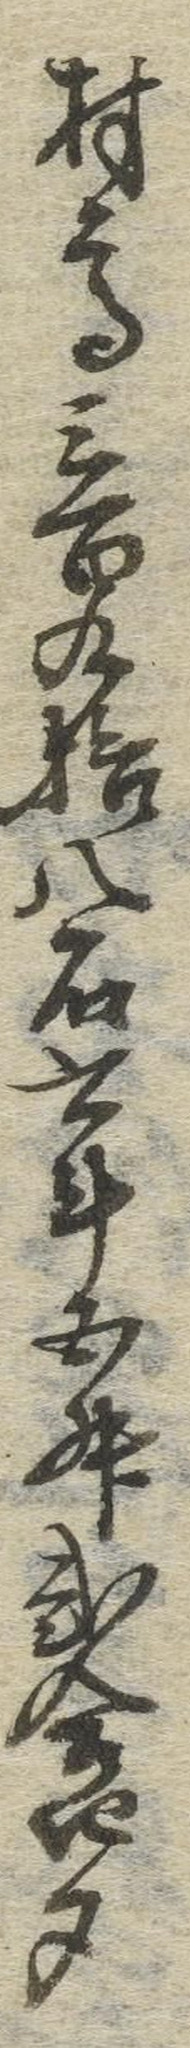村高三百九拾八石六斗五升弐合四夕
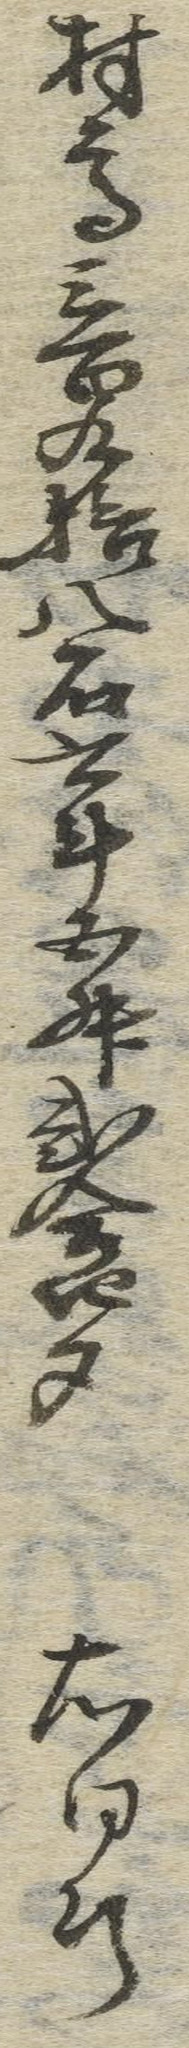村高三百九拾八石六斗五升弐合四夕
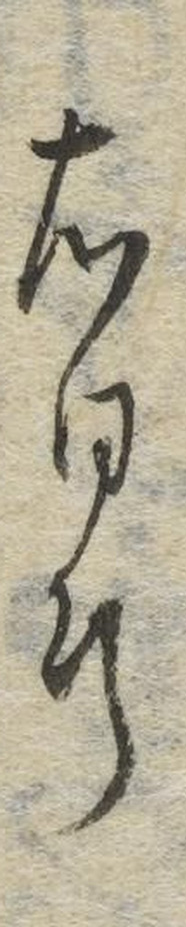右同断
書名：信濃越後　地震書留
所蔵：東京大学地震研究所図書室 Earthquake Research Institute Library, The University of Tokyo, JAPAN
